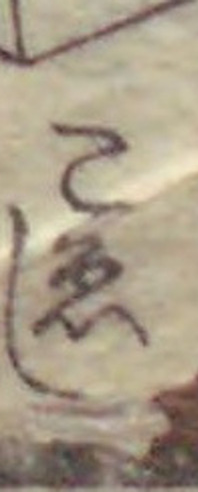こゑし
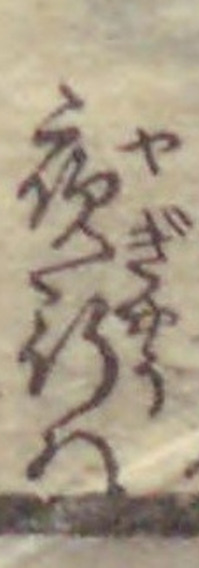夜行は
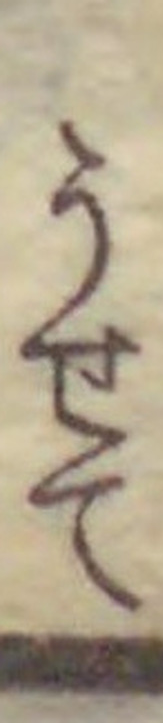うせて
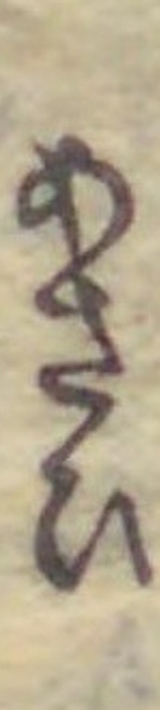あさひ
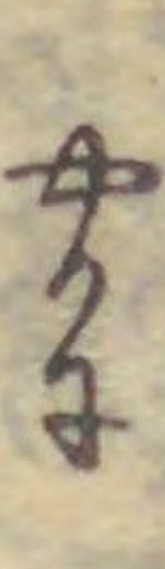やかに
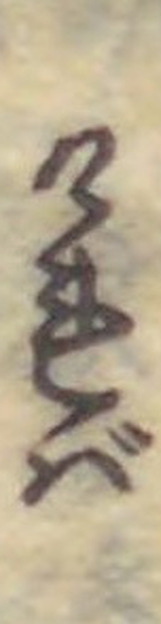ければ
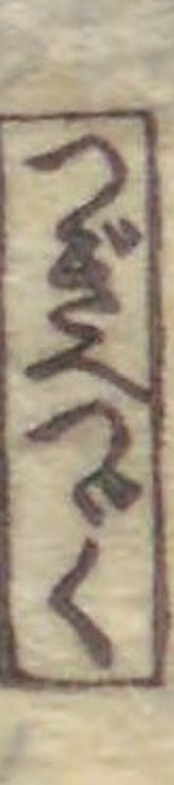つぎへつゞく

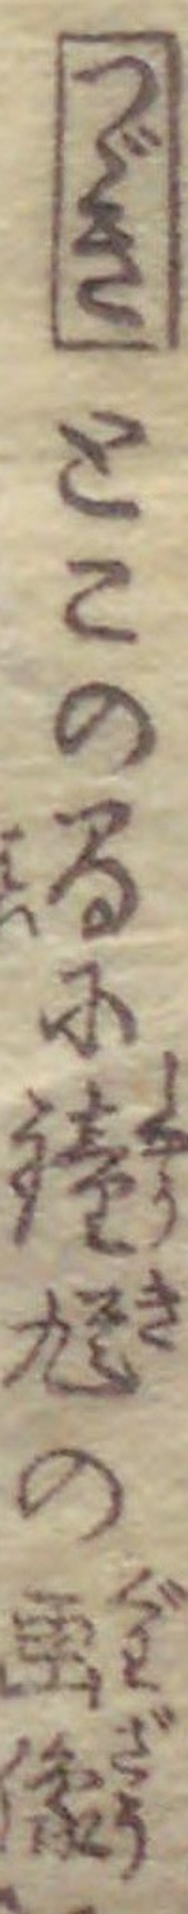つゞきとこの間に鍾馗の画像を
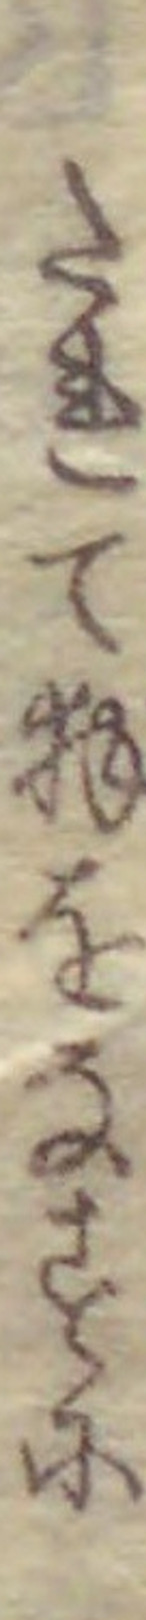たれて物をなすに
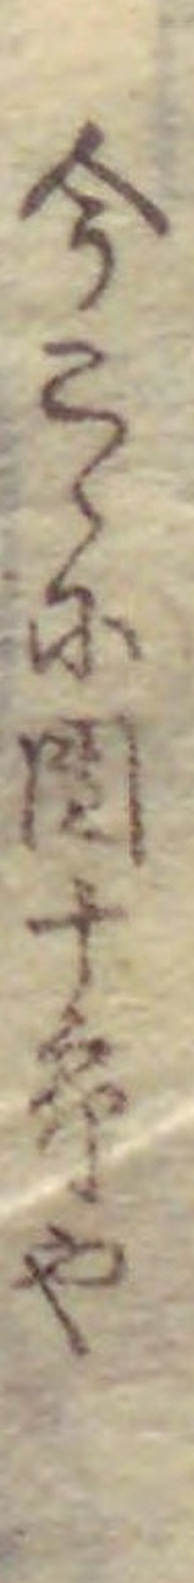今こゝに団十郎や
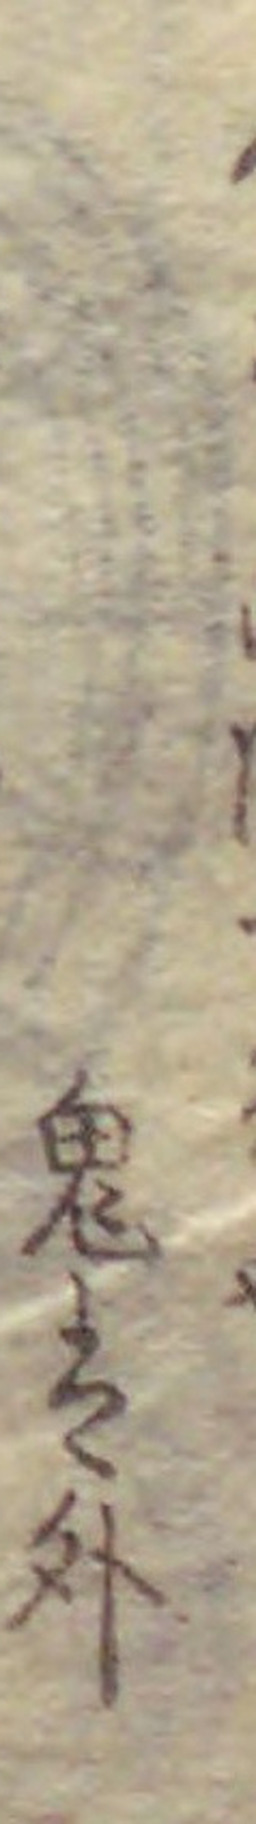鬼は外
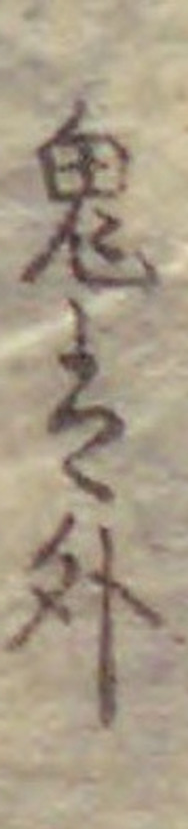鬼は外
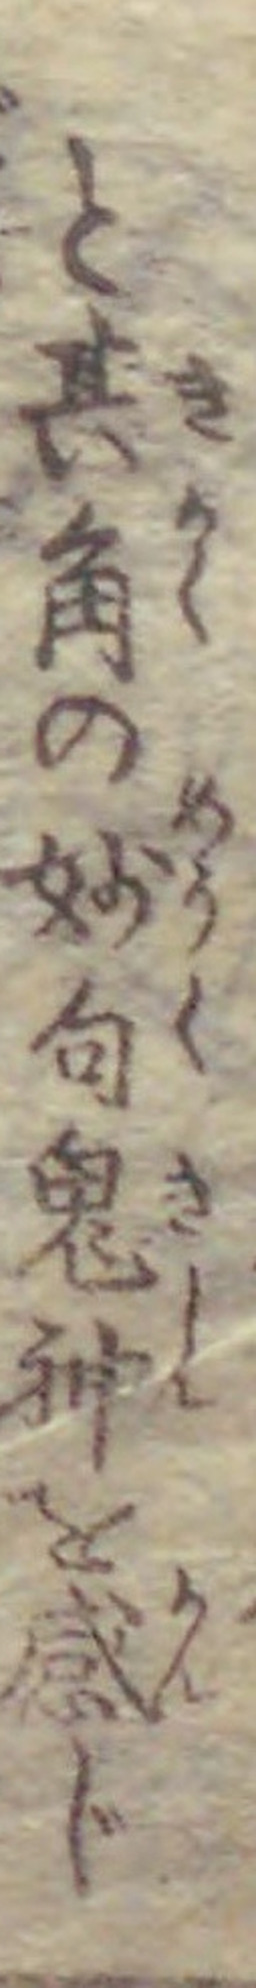と其角の妙句鬼神を感じ
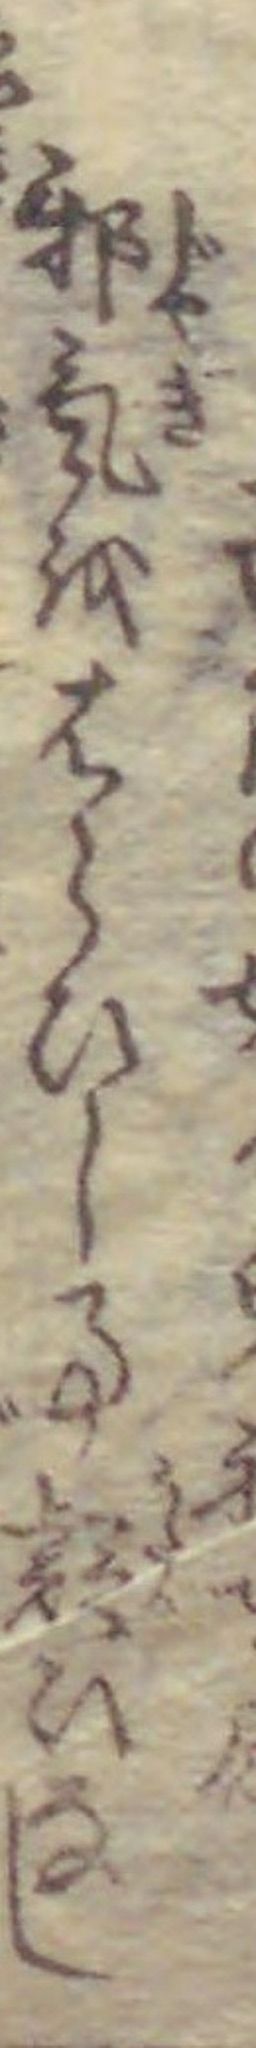邪気をはらひし事疑ひなし
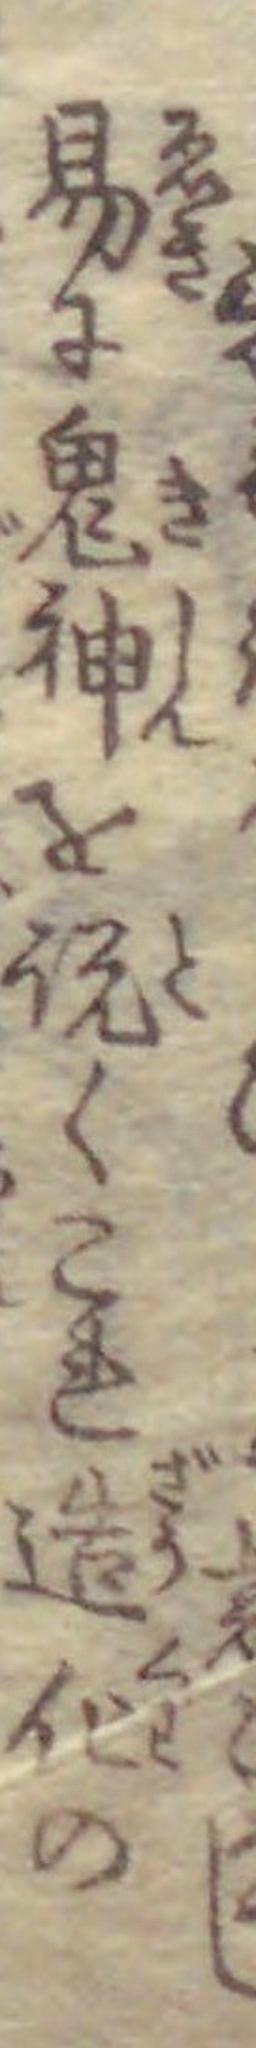易に鬼神を説くこれ造化の
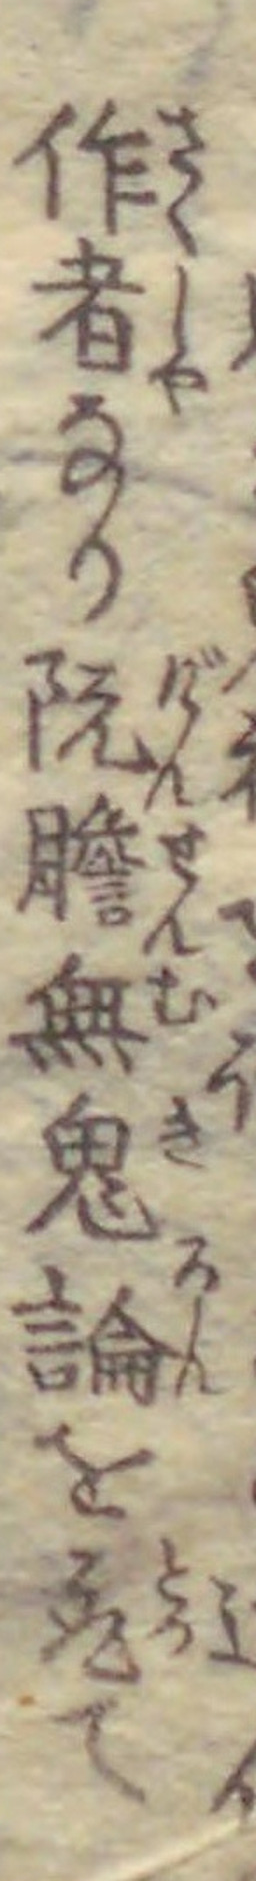作者なり阮瞻無鬼論を取て
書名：大時代唐土化物 3巻. 曽我太夫染
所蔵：国立国会図書館 National Diet Library, JAPAN
